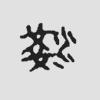淺
